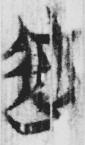述
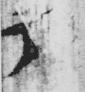亓（其）
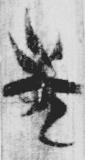先
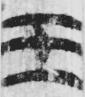王
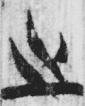之
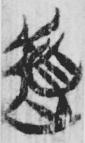道
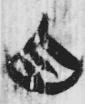自
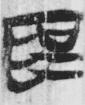爲
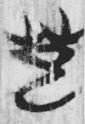芸
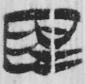爲
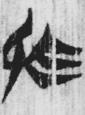於
